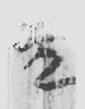元
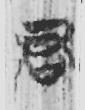君
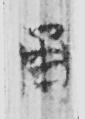甬
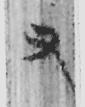又
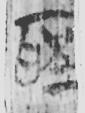聖
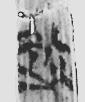政
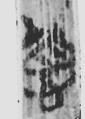惪
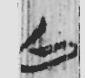㠯（以）
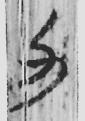力
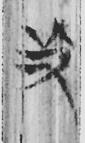及
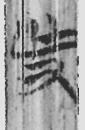拃（作）
